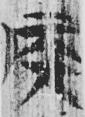侯
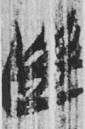○（絕）
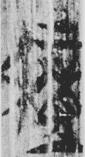穜（種）
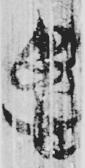○（侮）
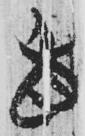眚（姓）
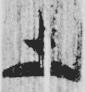土
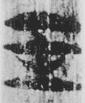玉
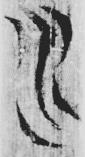水
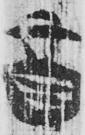酉（酒）
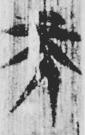天
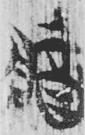将
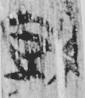○（诛）
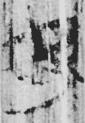𡚦（焉）
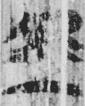○（吾）
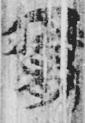○（勴）
